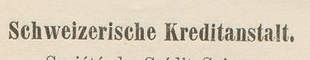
Schweizerische Kreditanstalt.
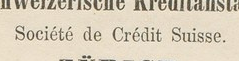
Société de Crédit Suisse.
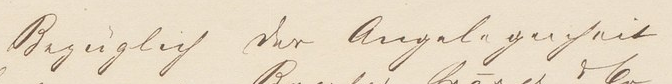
Bezüglich der Angelegenheit
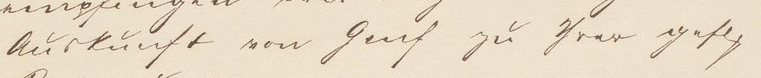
Auskunft von Genf zu Ihrer geflgen
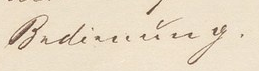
Bedienung.
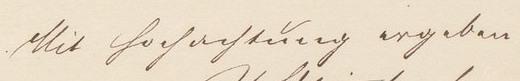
Mit Hochachtung ergeben
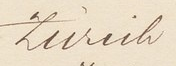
Zürich
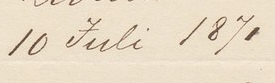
10 Juli 1871
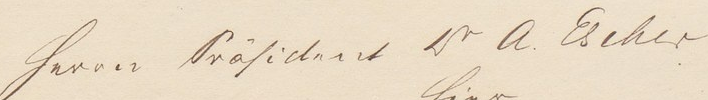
Herrn Präsident Dr A. Escher
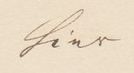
hier
